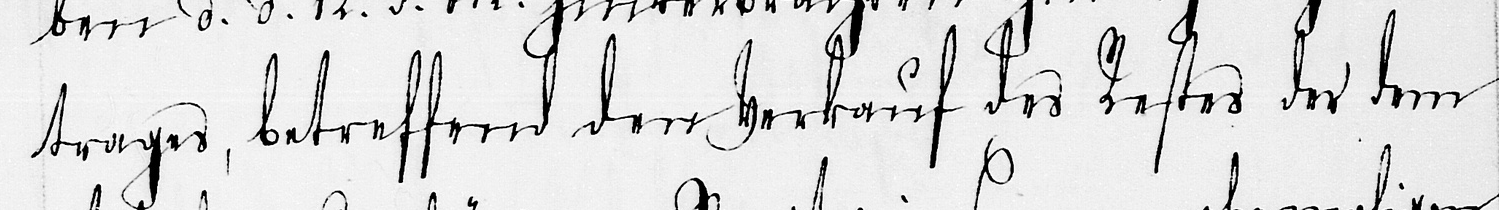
trages, betreffend den Verkauf des Restes der dem
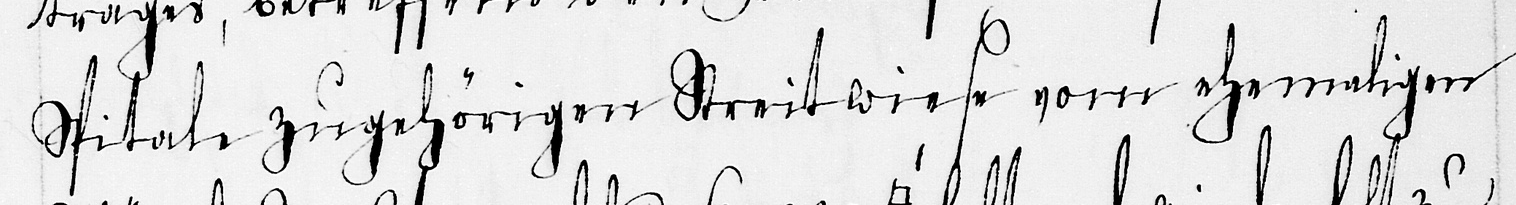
Spitale zugehörigen Streitwiese vom ehemaligen
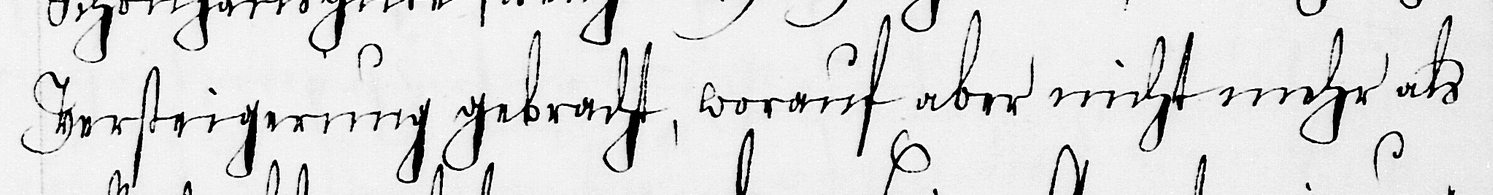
Versteigerung gebracht, worauf aber nicht mehr als
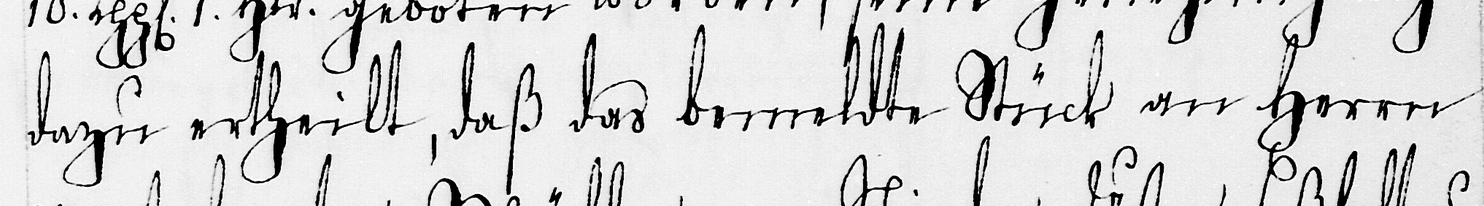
dazu ertheilt, daß das bemeldte Stück an Herrn
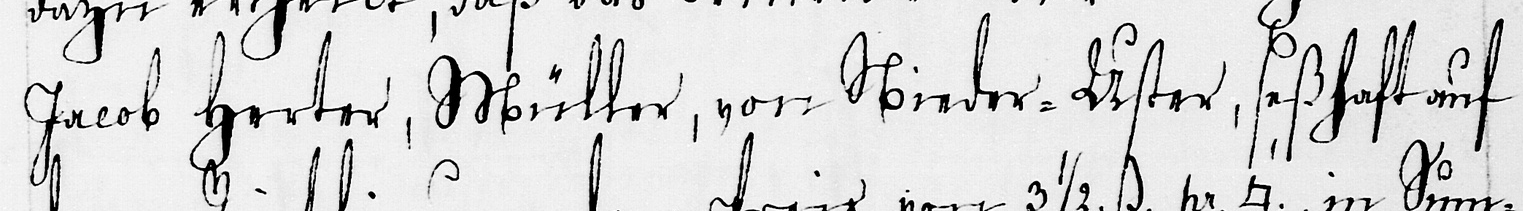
Jacob Herter, Müller, von Nieder-Uster, seßhaft auf
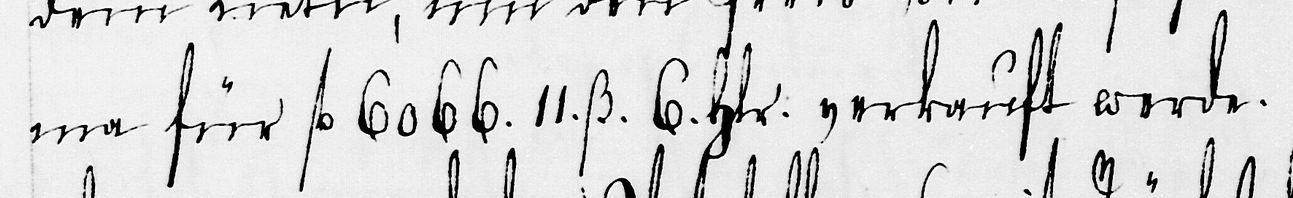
mma für fl 6066. 11. ß. 6. Hlr. verkauft werde.
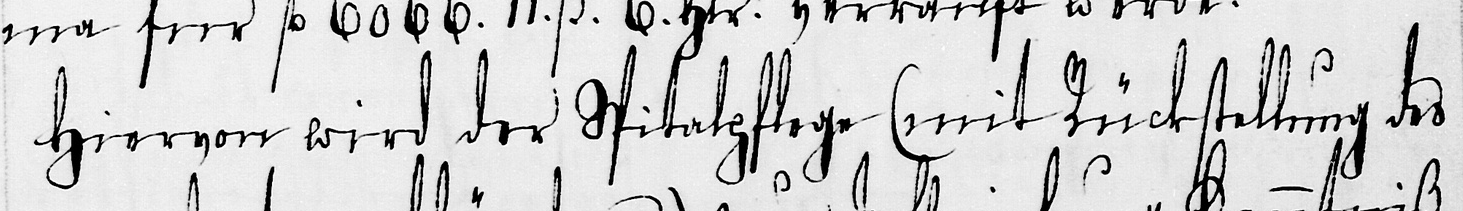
Hiervon wird der Spitalpflege (mit Rückstellung des
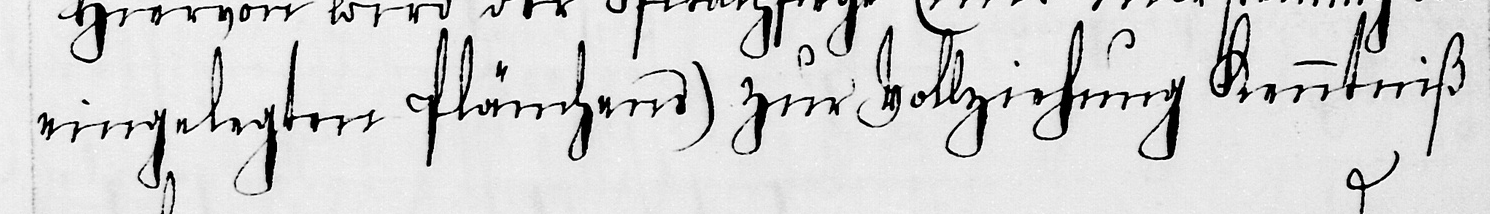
eingelegten Plänchens) zur Vollziehung Kenntniß
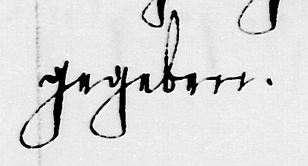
gegeben.
